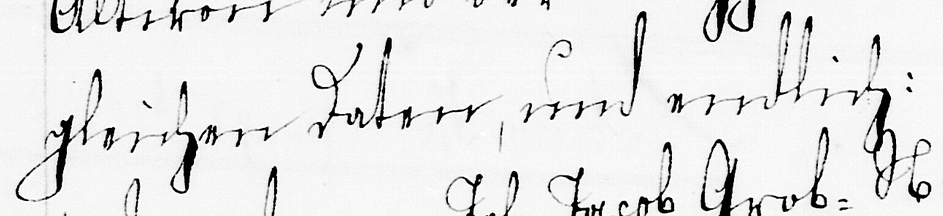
gleichen Daten, und endlich:
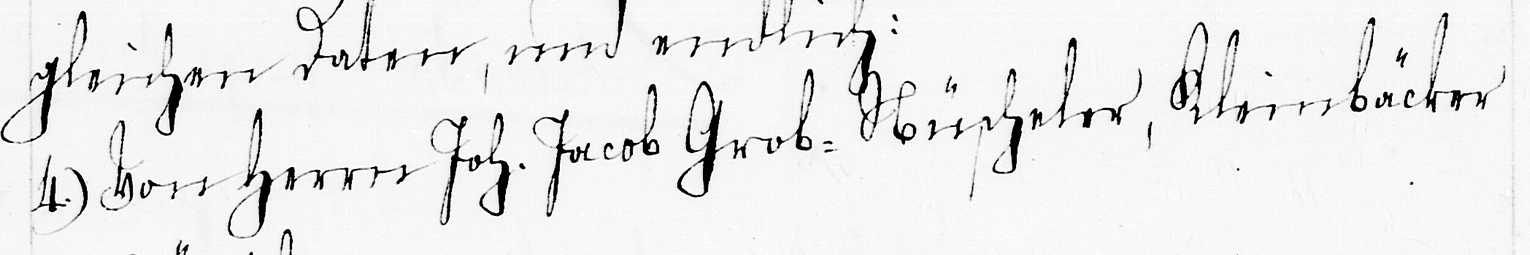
4.) Von Herrn Joh. Jacob Grob-Nüscheler, Kleinbäcker
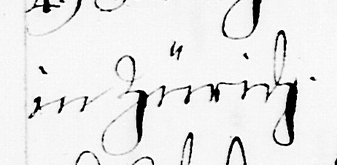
in Zürich.
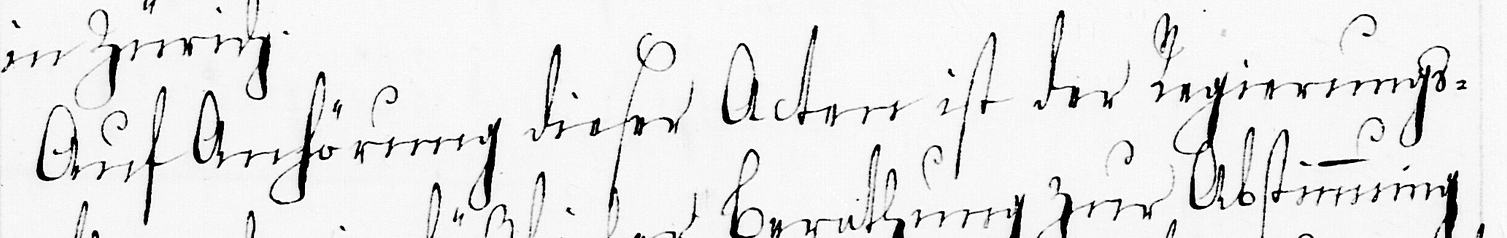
Auf Anhörung dieser Acten ist der Regierungs¬
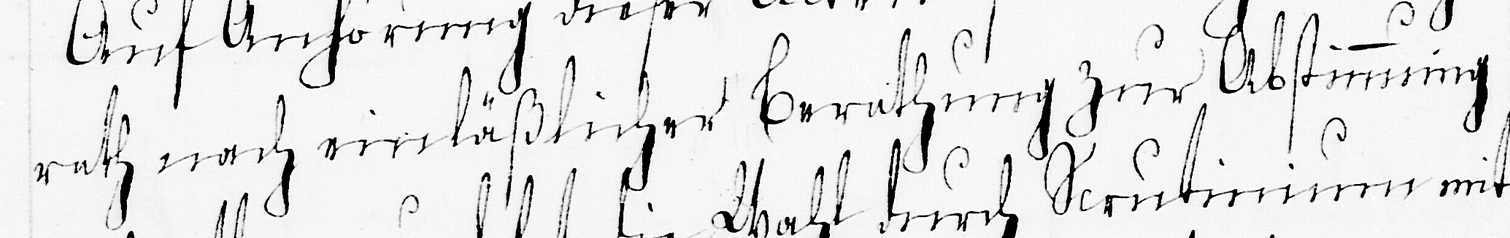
rath nach einläßlicher Berathung zur Abstimmung
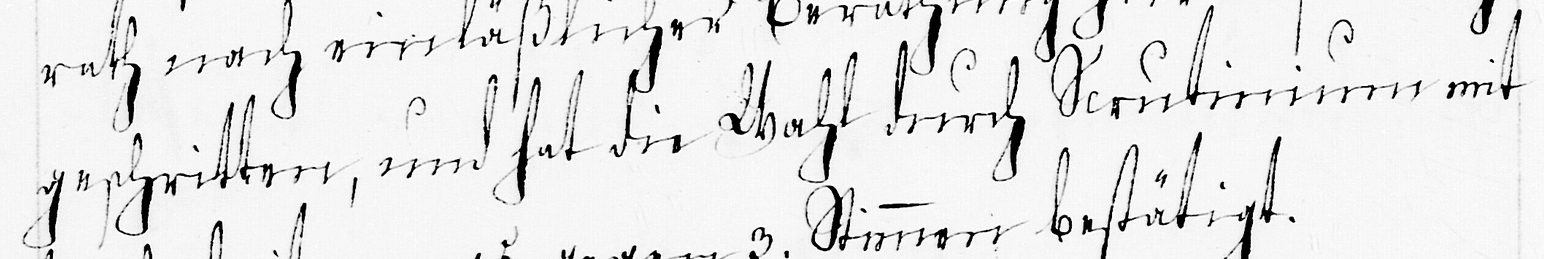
geschritten, und hat die Wahl durch Scrutinium mit
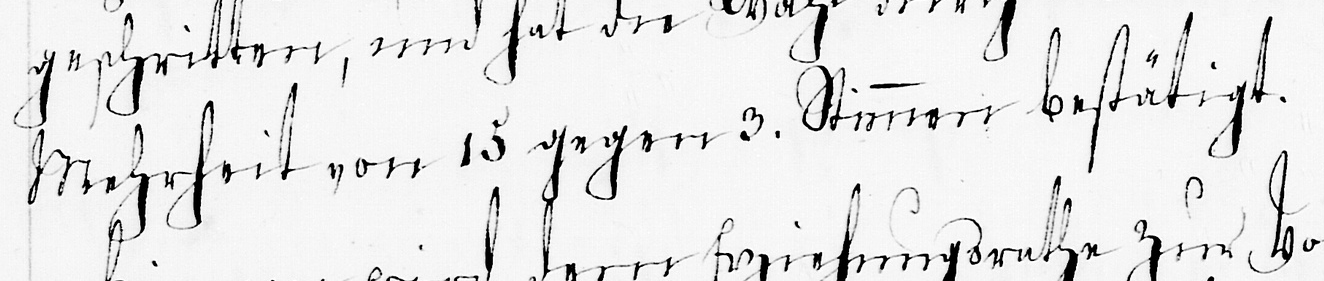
Mehrheit von 15 gegen 3. Stimmen bestätigt.
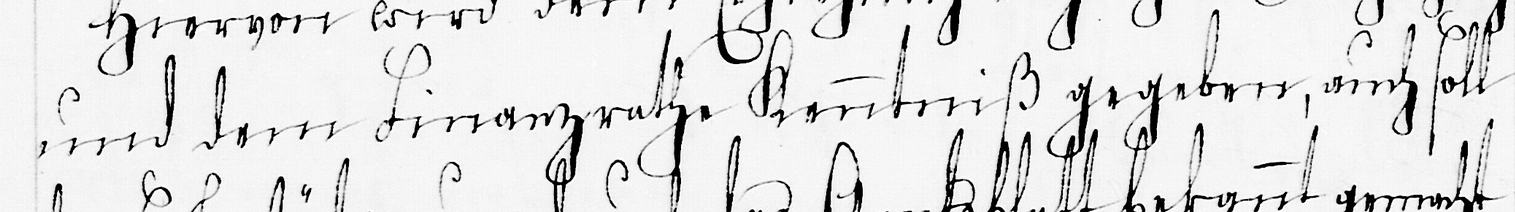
und dem Finanzrathe Kenntniß gegeben, auch soll
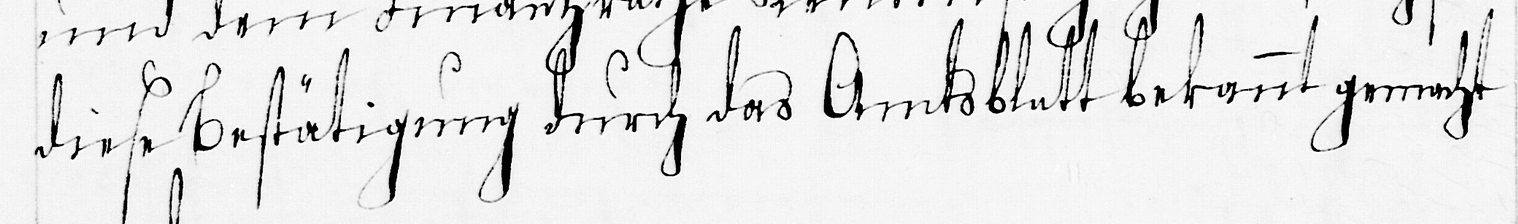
diese Bestätigung durch das Amtsblatt bekannt gemacht
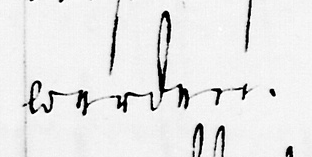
werden.
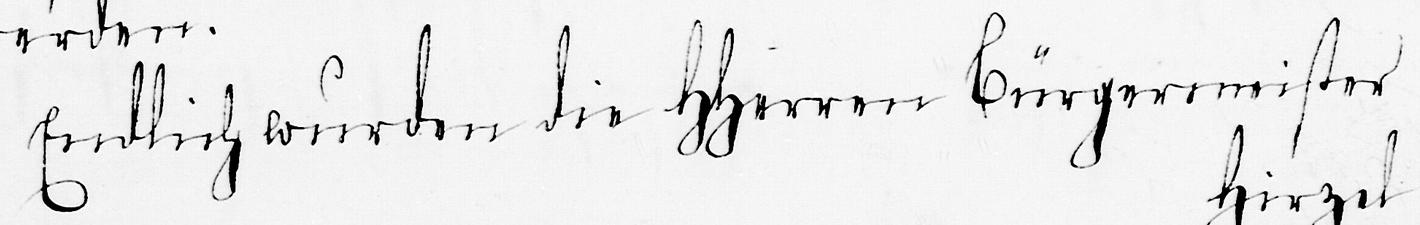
Endlich wurden die HHerren Bürgermeister
